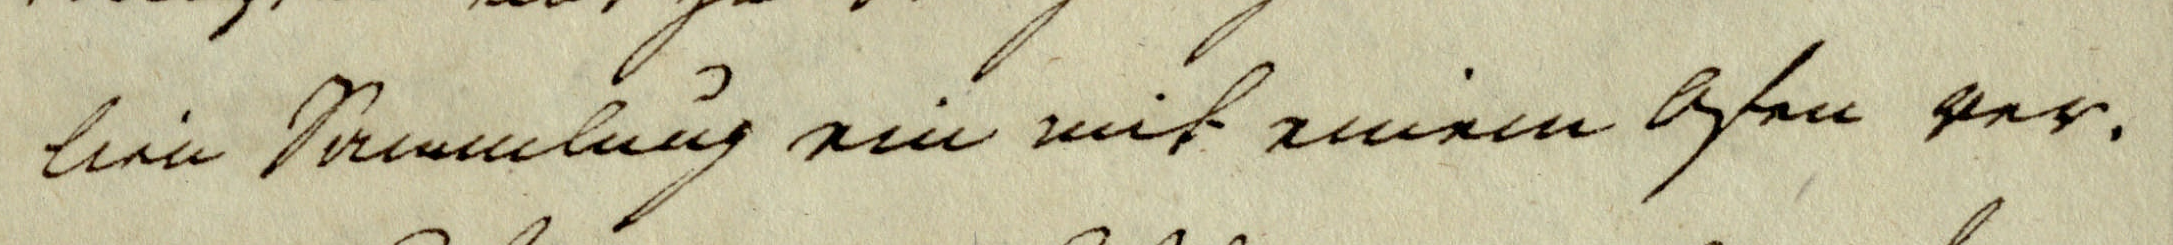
lien Sammlung ein mit einem Ofen ver¬
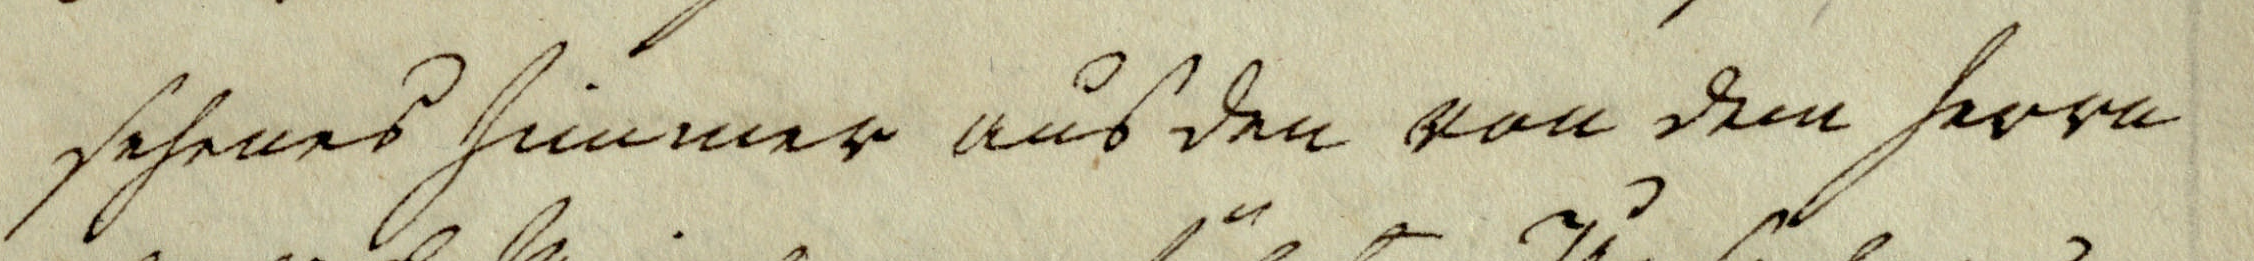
sehenes Zimmer aus den von dem Herrn
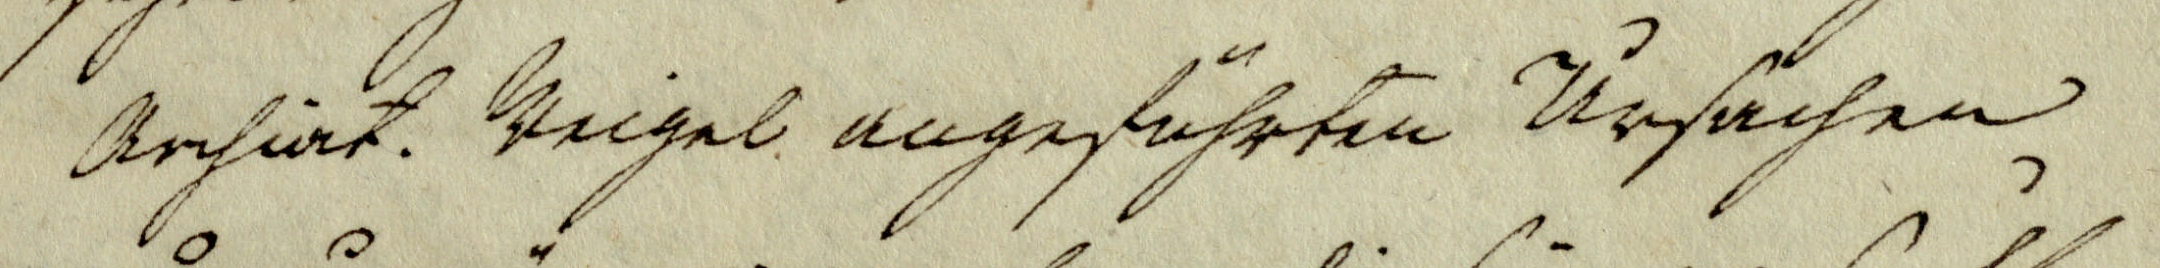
Archiat. Weigel angeführten Ursachen
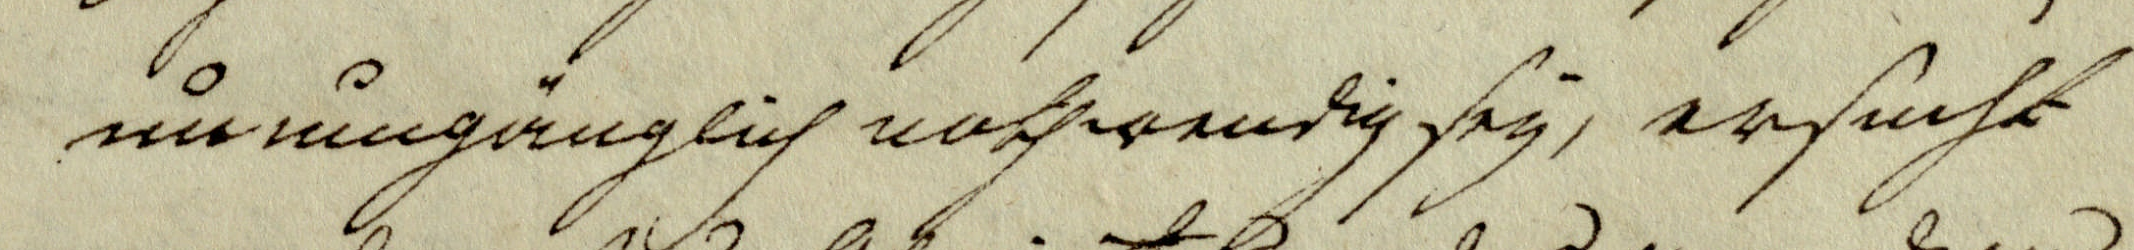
unumgänglich nothwendig seÿ, ersucht
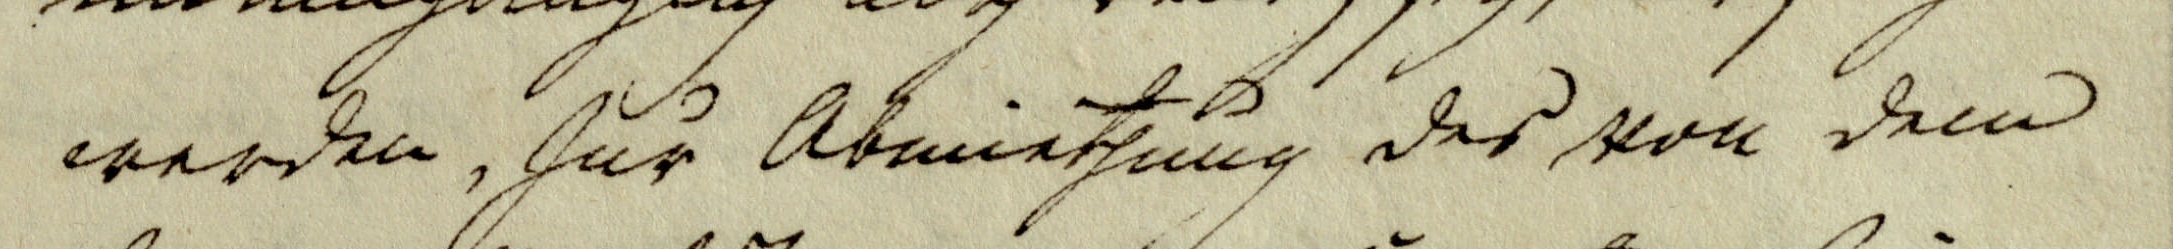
werden, zur Abmiethung des von dem
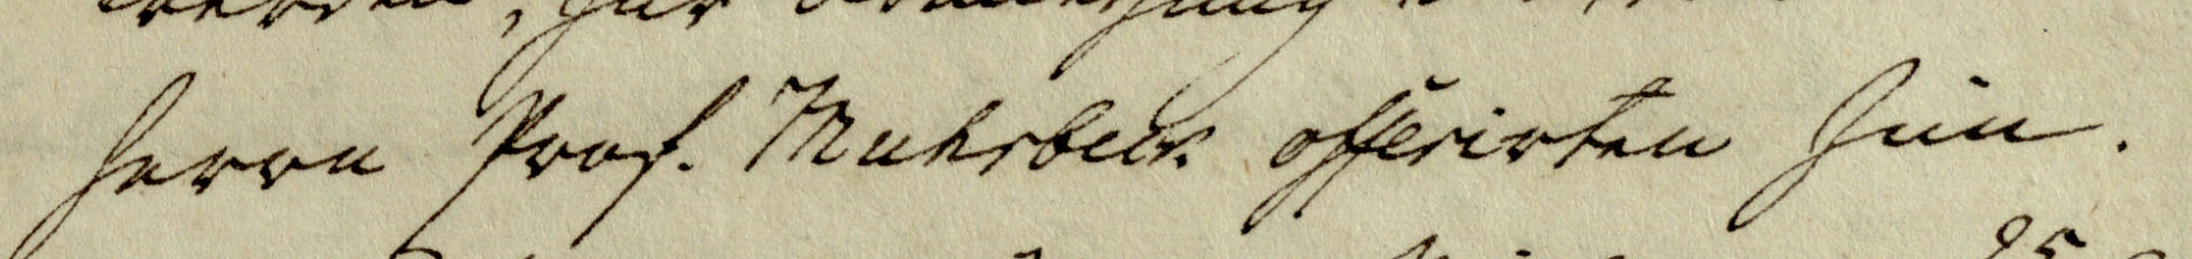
Herrn Prof. Muhrbeck offerirten Zim¬
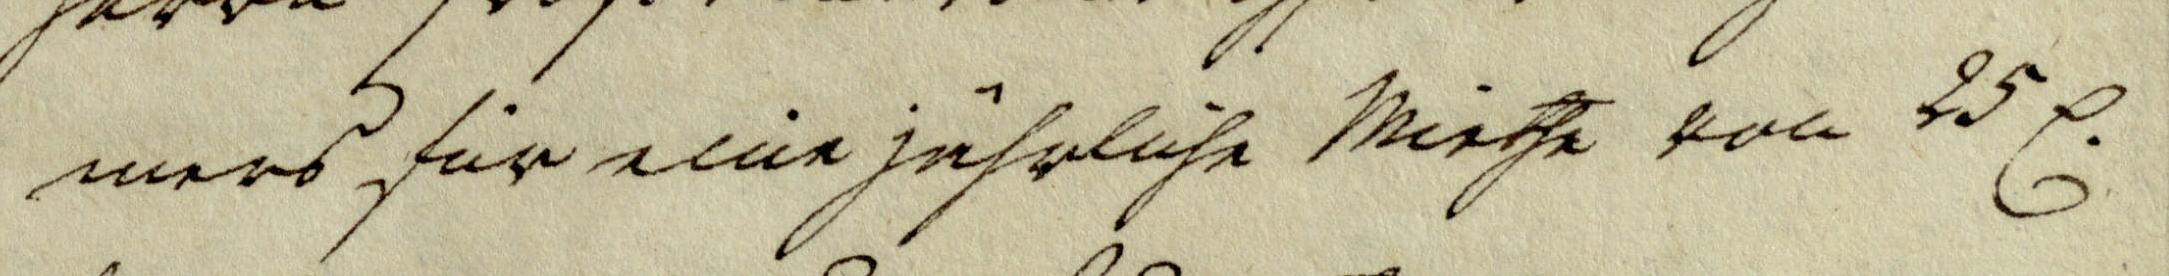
mers für eine jährliche Miethe von 25 l.
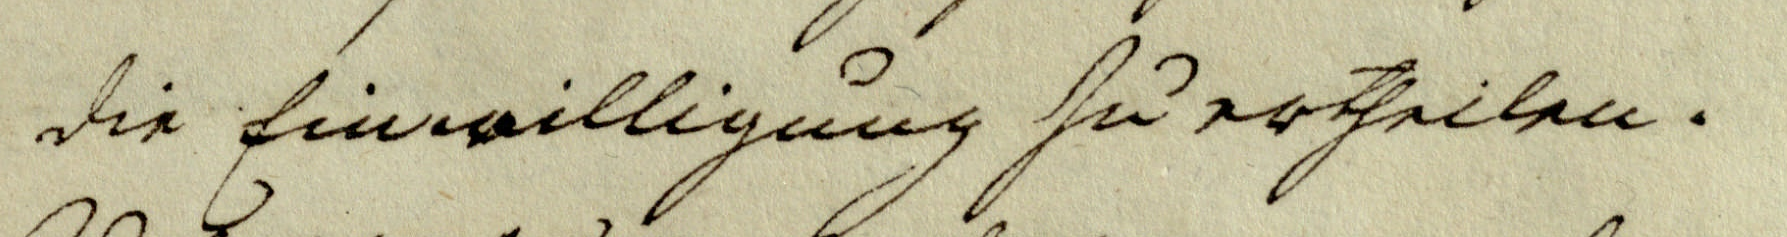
die Einwilligung zu ertheilen.
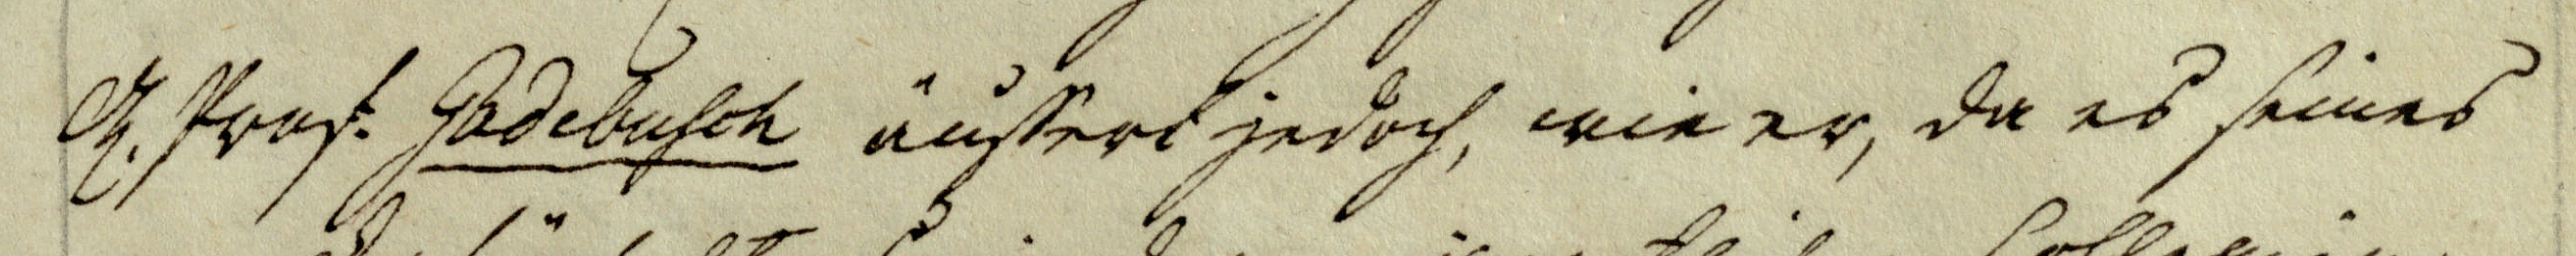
dh. Prof. Gadebusch äussert jedoch, wie er, da es seines
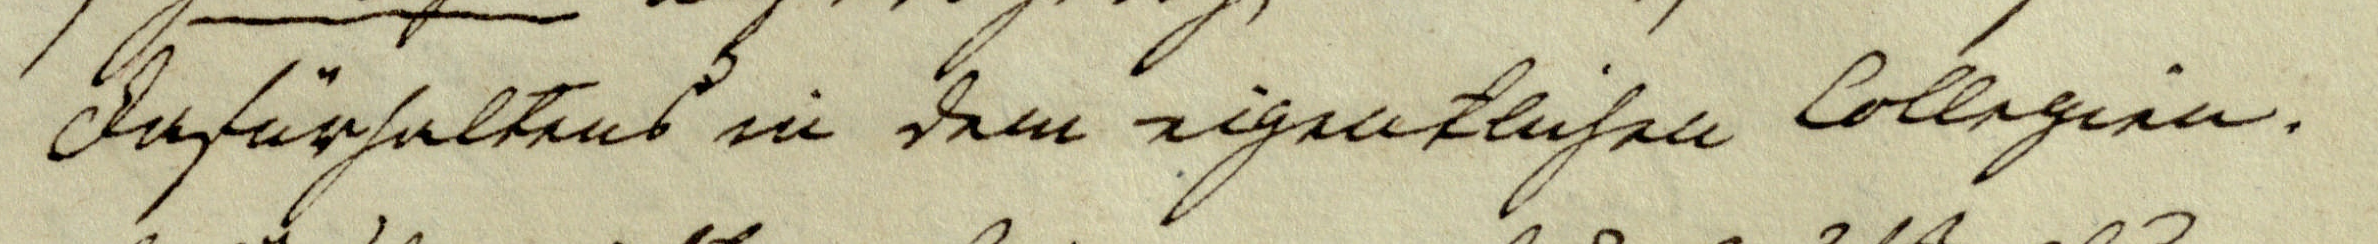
Dafürhaltens in dem eigentlichen Collegien¬
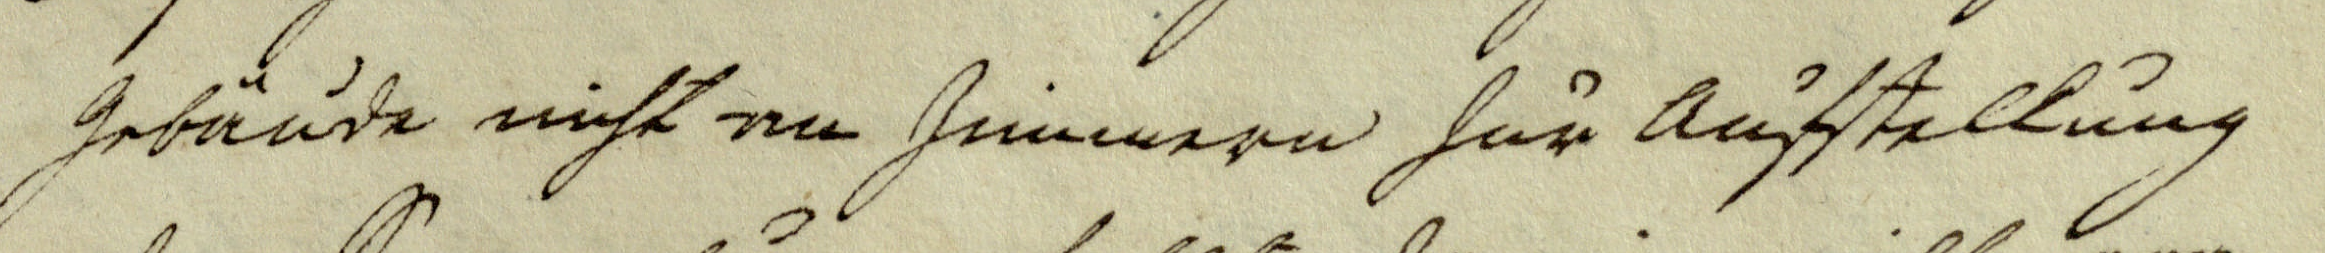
Gebäude nicht an Zimmern zur Aufstellung
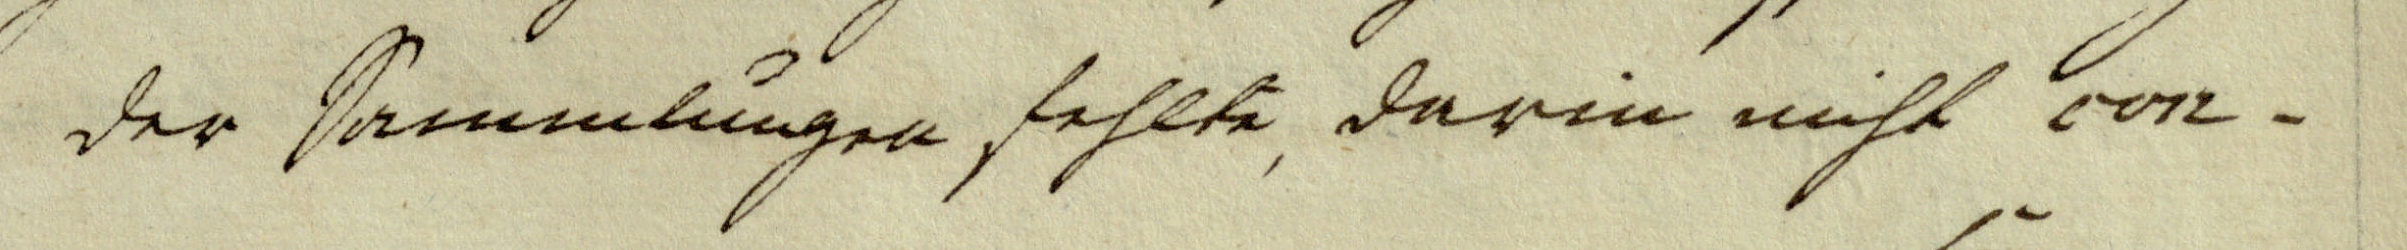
der Sammlingen fehlte, darin nicht con¬
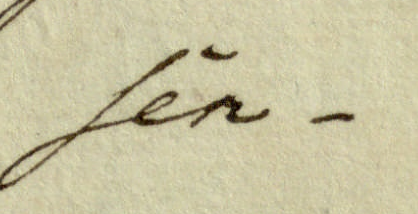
sen¬
